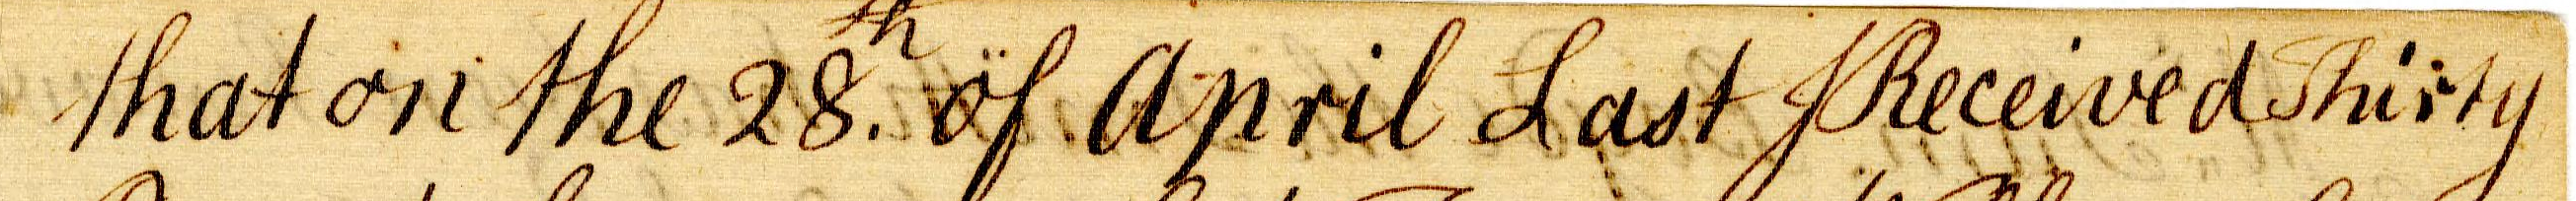that on the 28^th. of April Last I Received Thirty
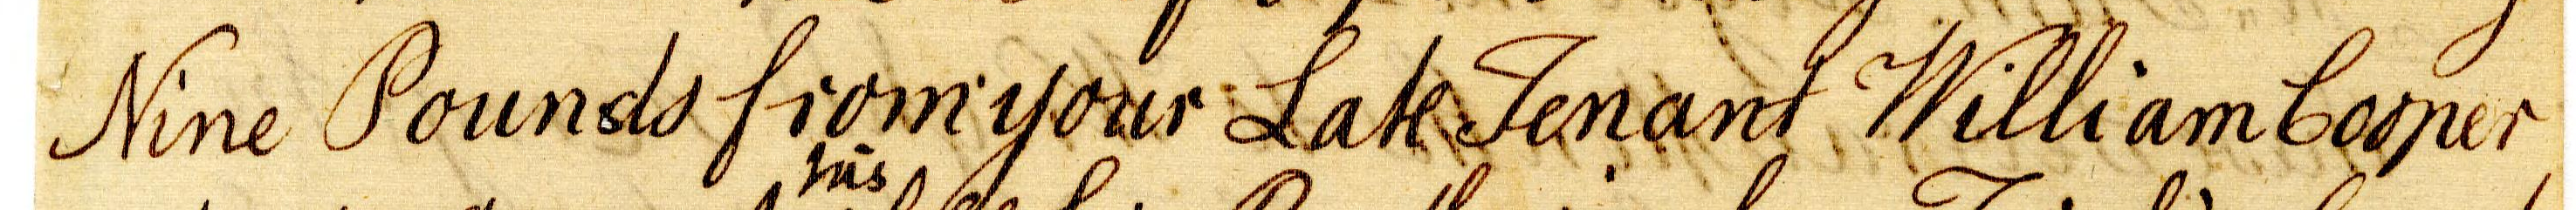Nine Pounds from Your Late Tenant William Cooper
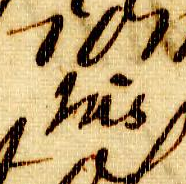his
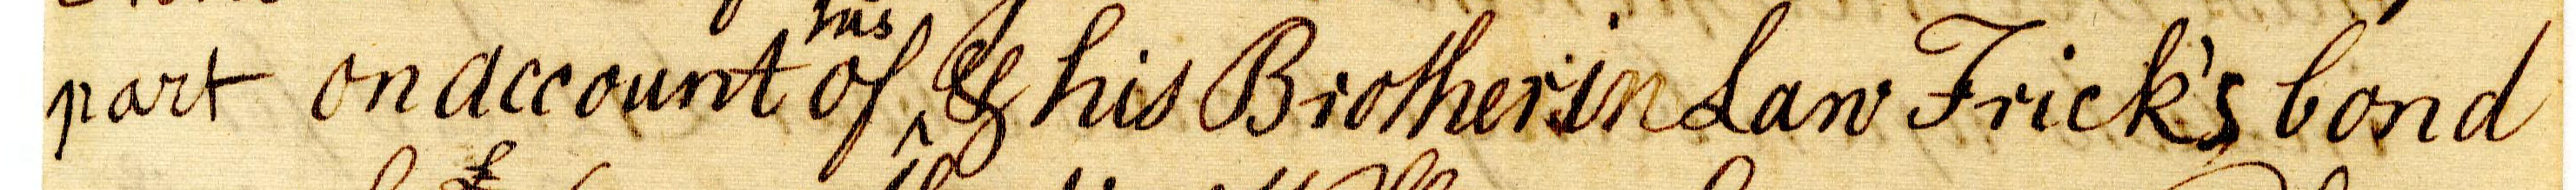part on Account of ^ & his Brother in Law Frick's bond
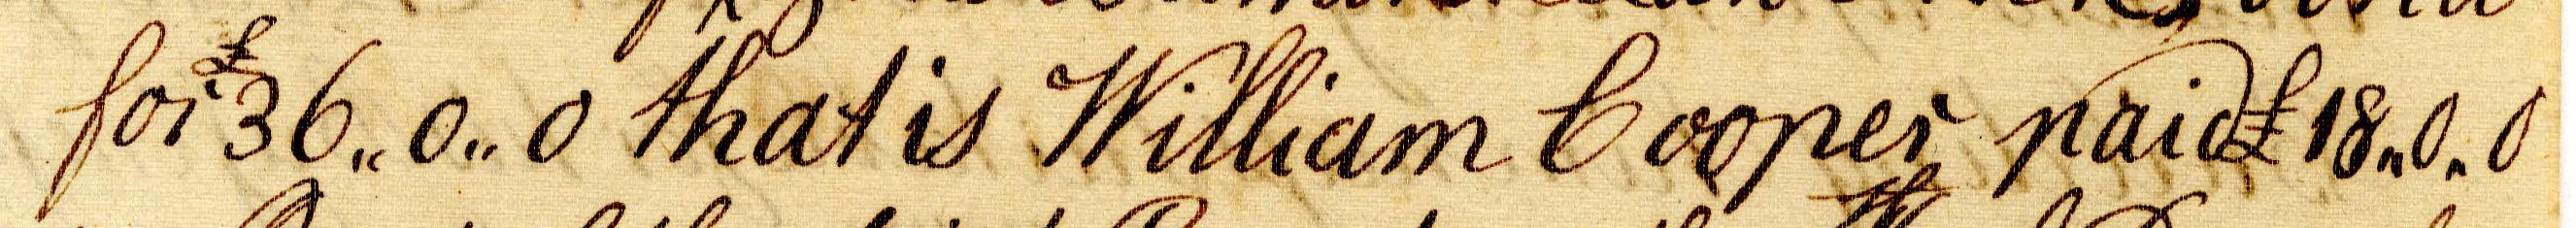for ^£36..0..0 that is William Cooper paid £18..0..0
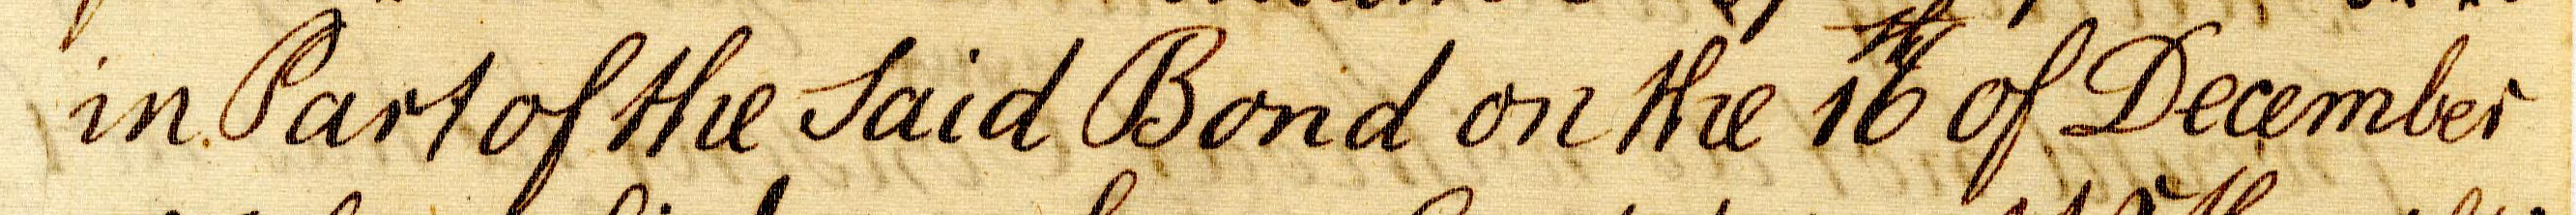in Part of the said Bond on the 16^th of December
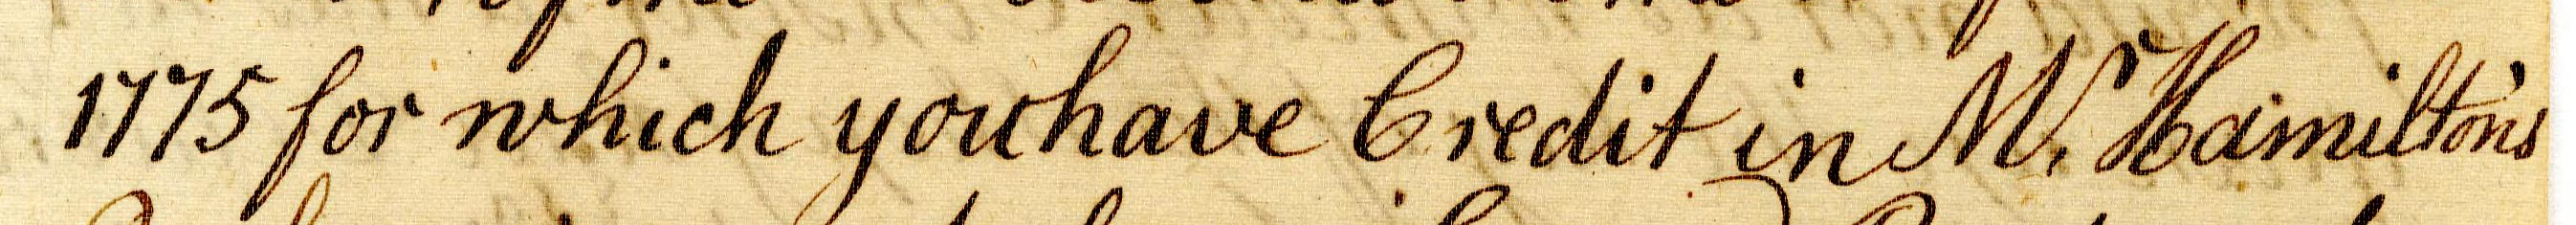1775 for which you have Credit in M^r. Hamilton's
